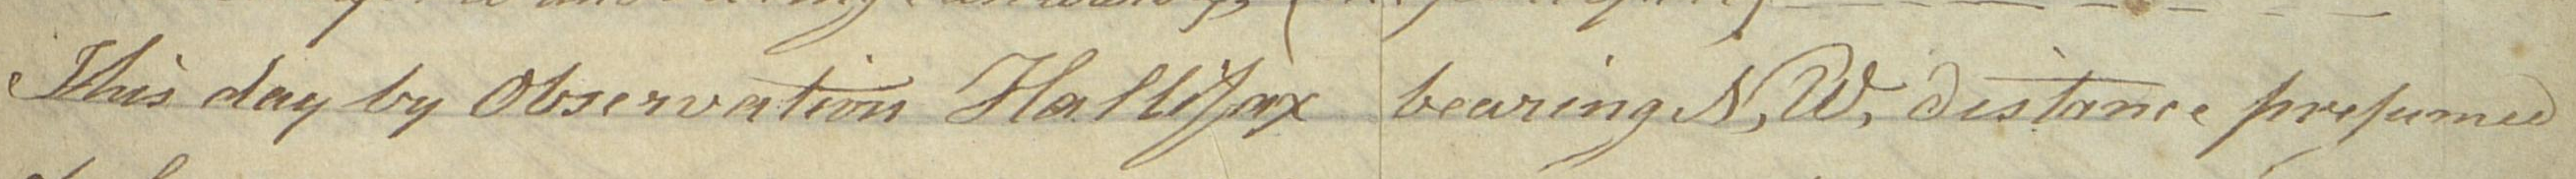This day by Observation Hallifax bearing N. W. distance presumed
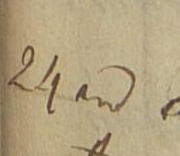24 and
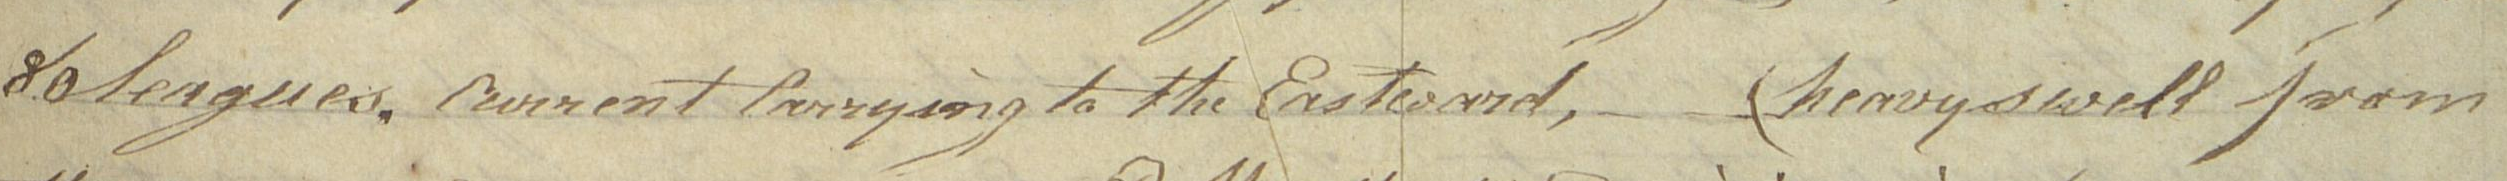80 leagues. current Carrying to the Eastward, (heavy swell from
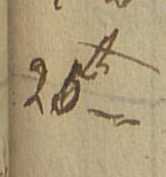25^th
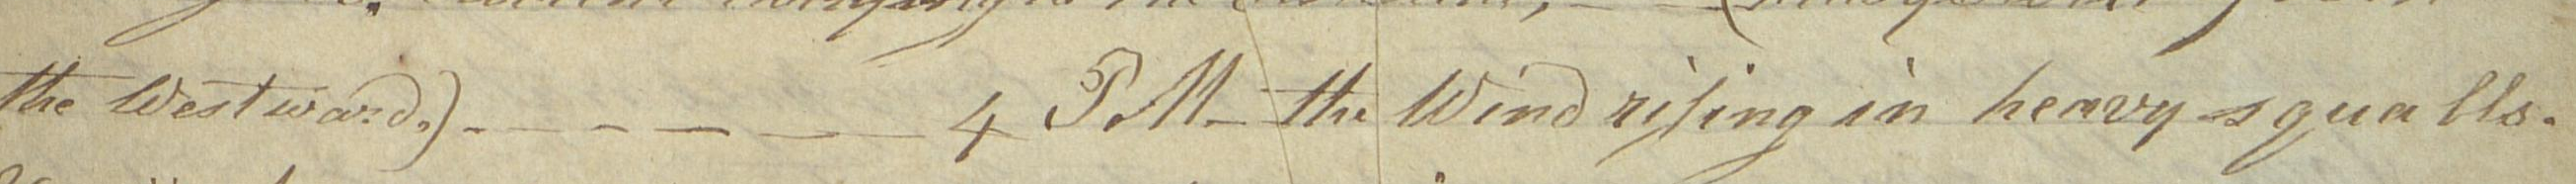the Westward.) 4 PM. The Wind rising in heavy squalls.
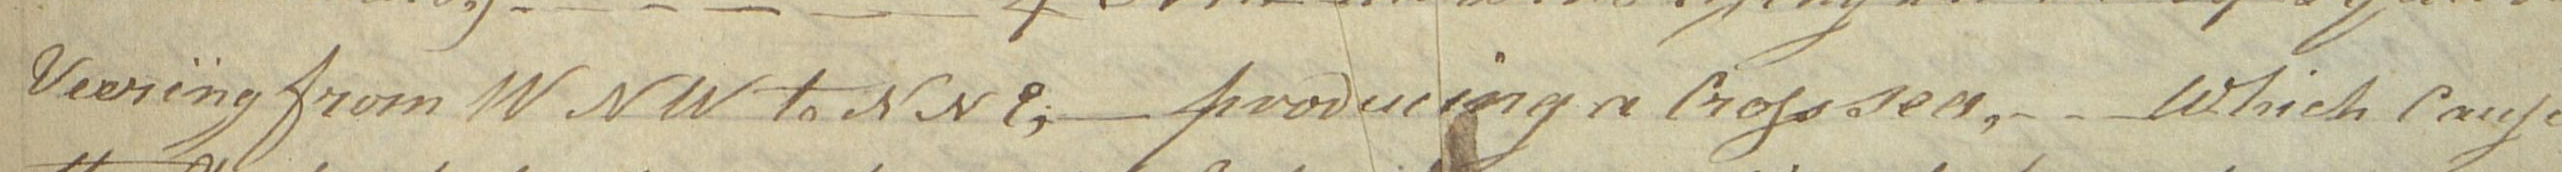Veering from WNW to NNE, providing a Cross Sea, Which Cause
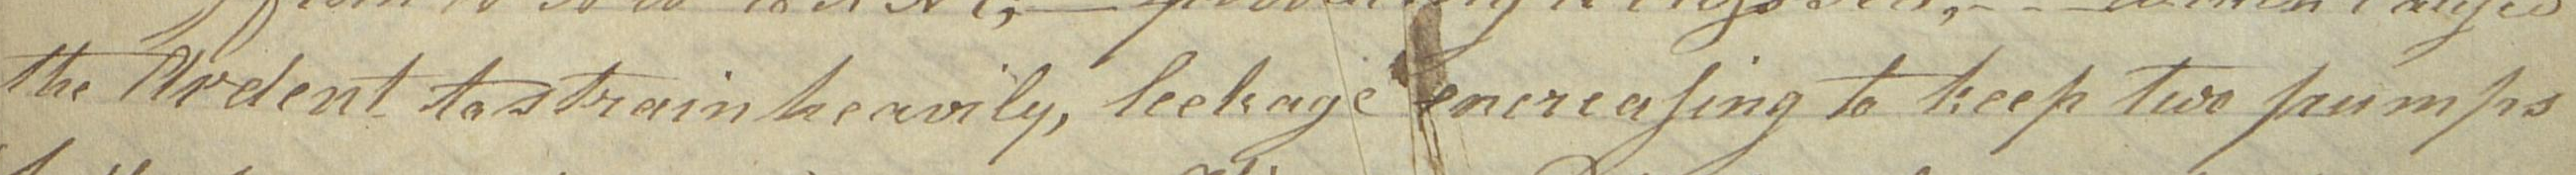the Ardent to strain heavily, leekage Encreasing to keep two pumps
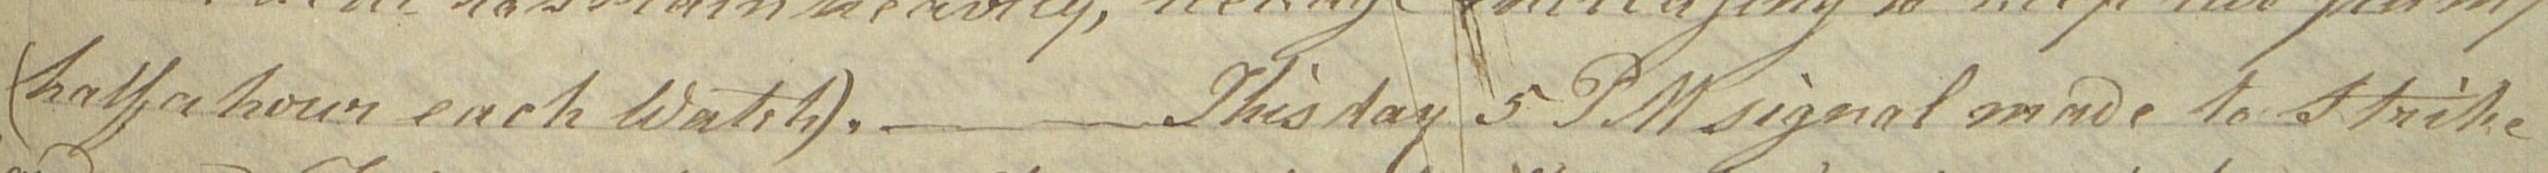(half a hour each Watch). This day 5 PM signal made to strike
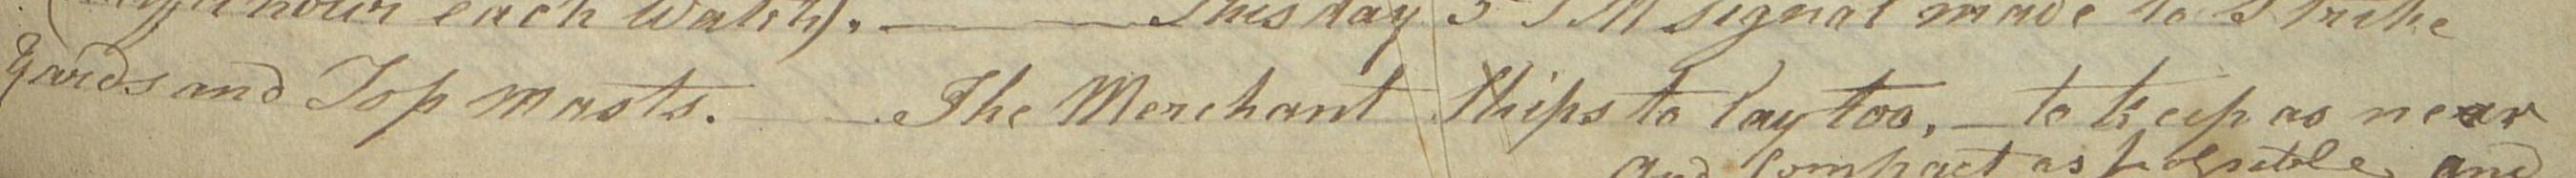Yards and Top masts. The Merchant Ships to lay too, to keep as near
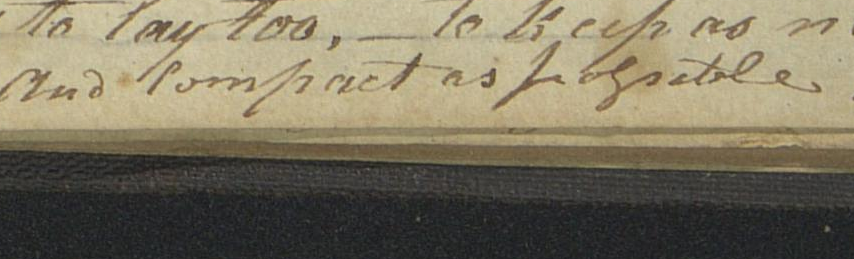And Compact as possable and
